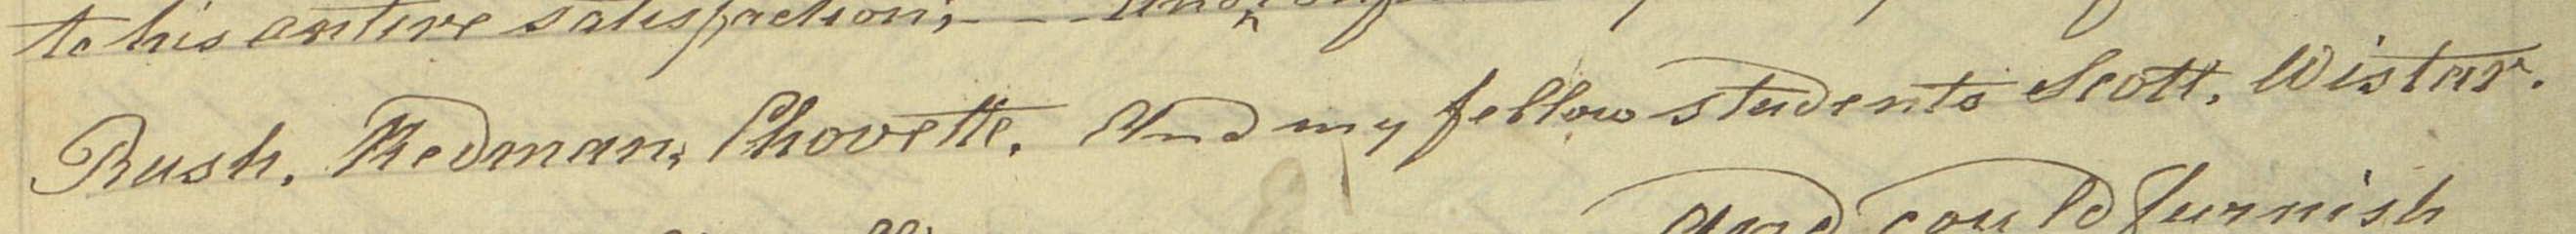Rush, Redman, Chovette, And my fellow students Scott, Wistar,
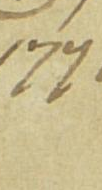1778
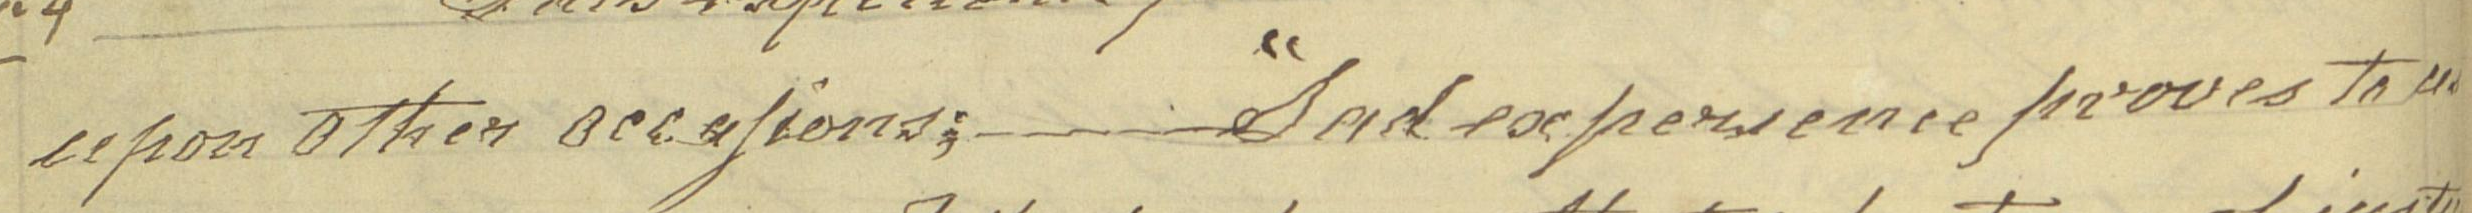upon other occasions; "Sad experience proves to us
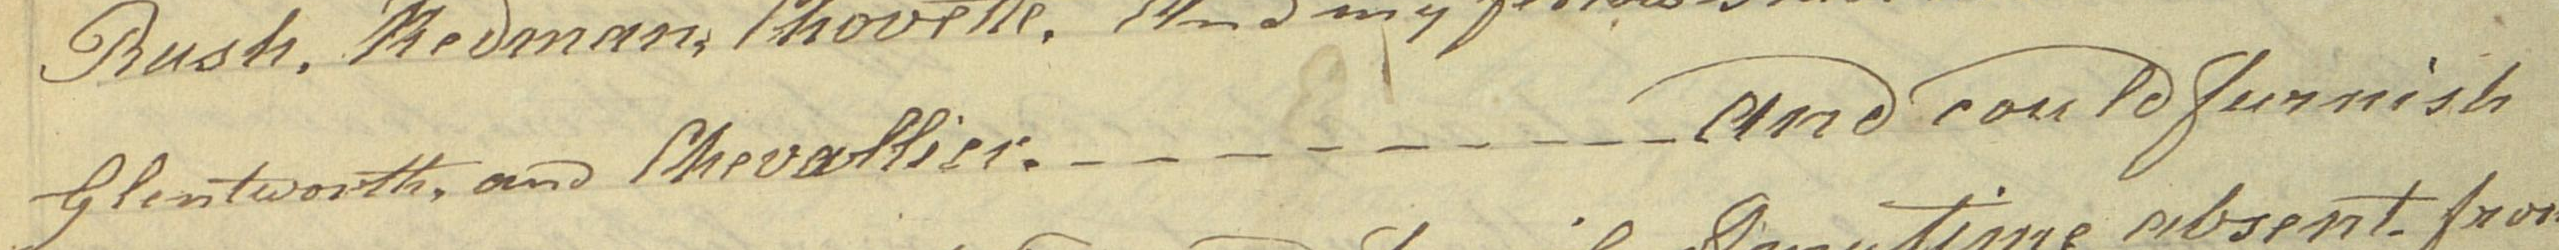Glentworth, and Chevallier. And could furnish
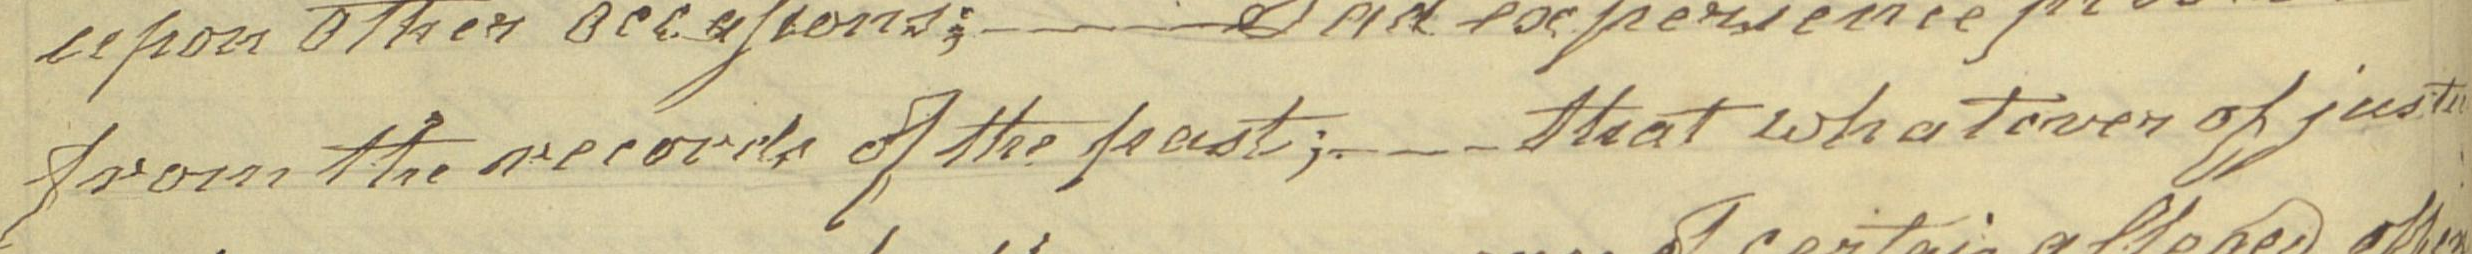from the records of the past; that whatever of just-
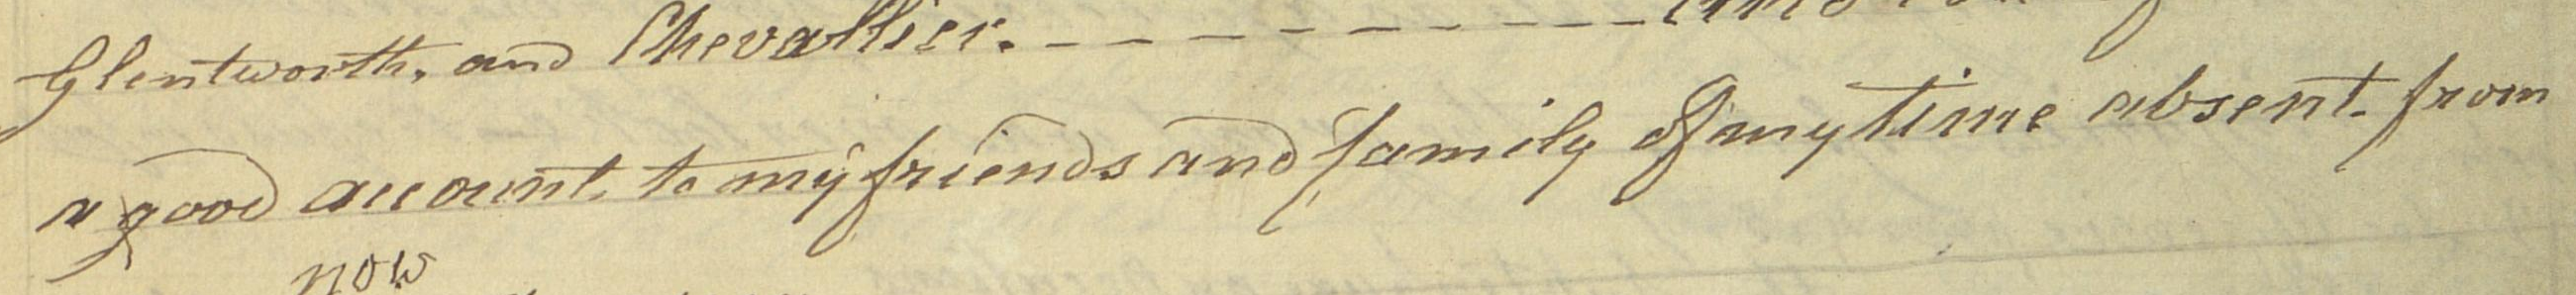a good account to my friends and family of my time absent from
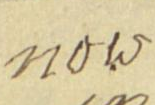now
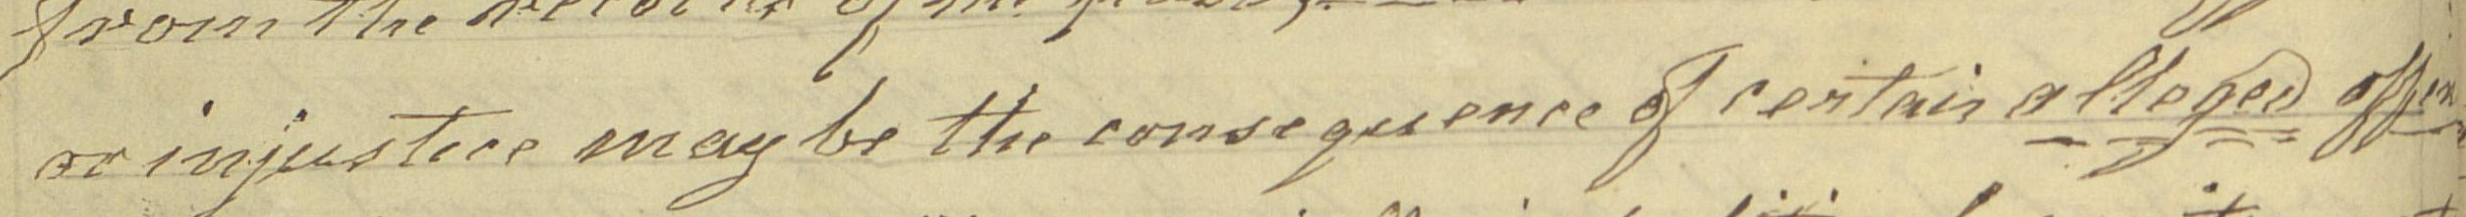or injustice may be the consequence of certain alleged offen-
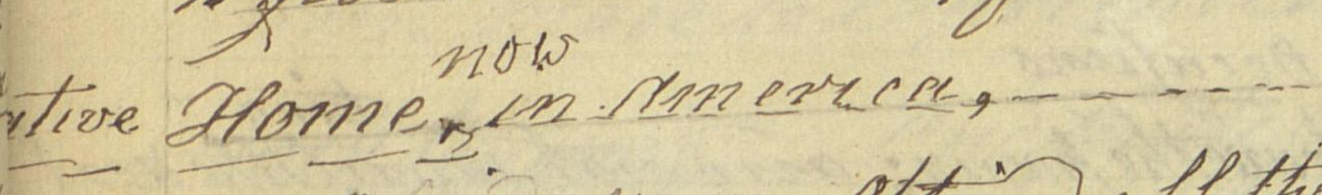-tive Home ^ in America,
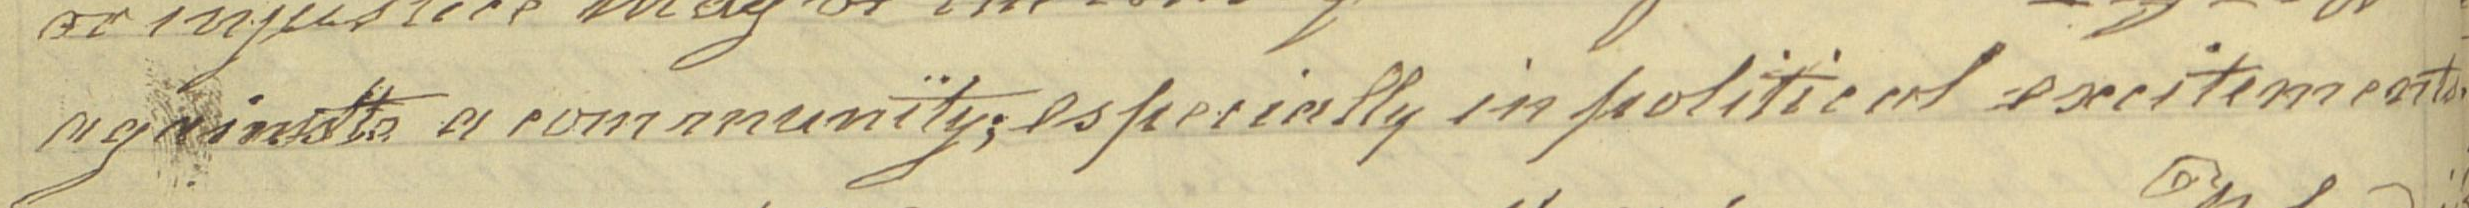against a community; especially in political excitements
